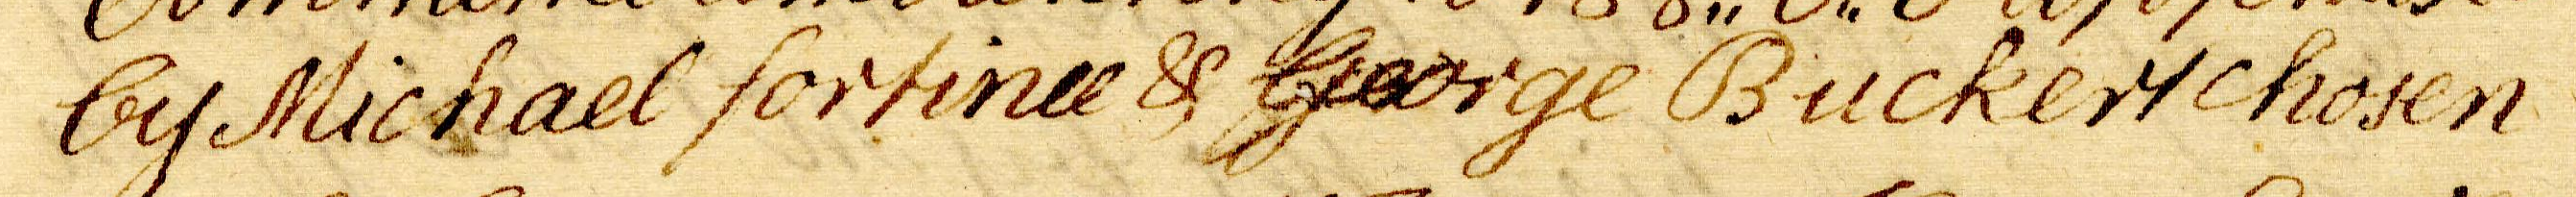by Michael fortince & George Buckers chosen
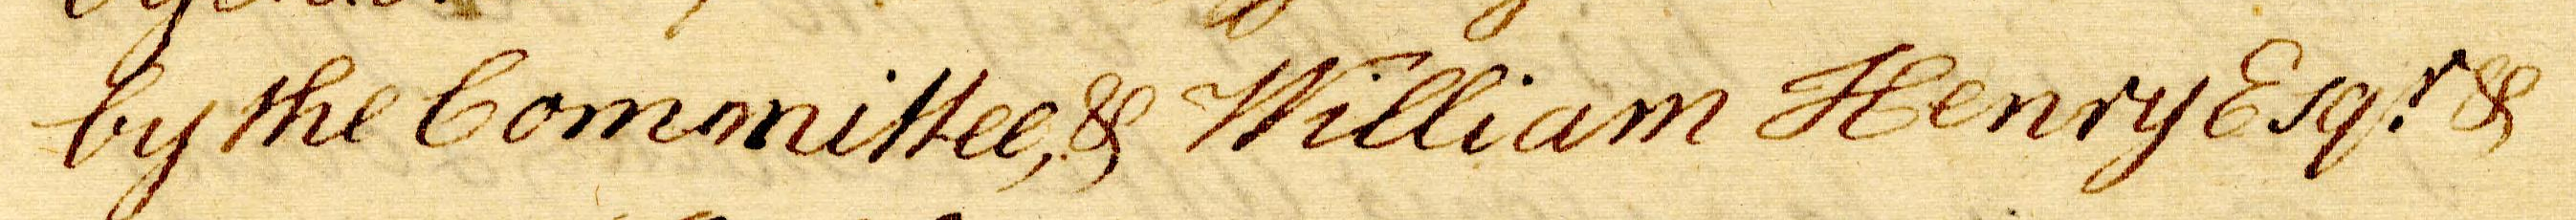by the Committee, & William Henry Esq^r. &
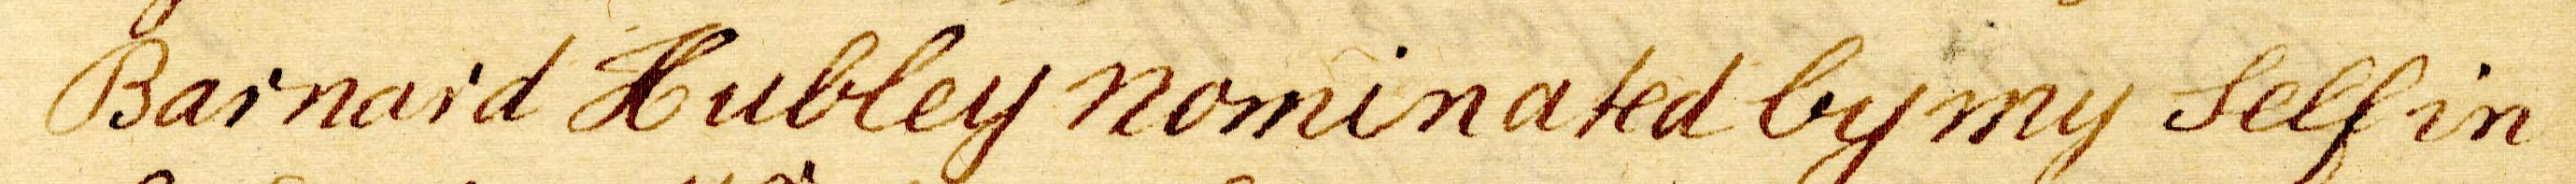Barnard Hubley nominated by my Self in
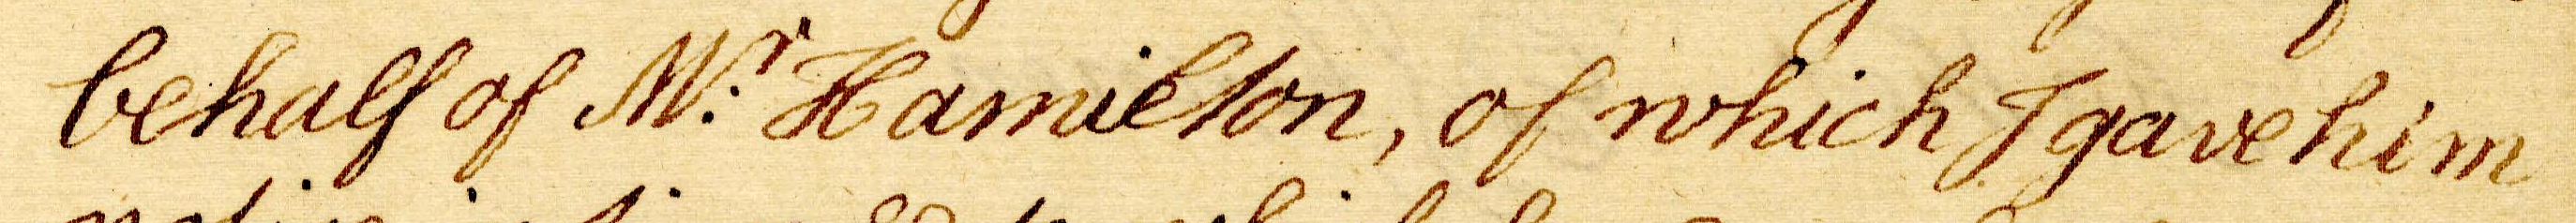behalf of M^r: Hamilton, of which I gave him
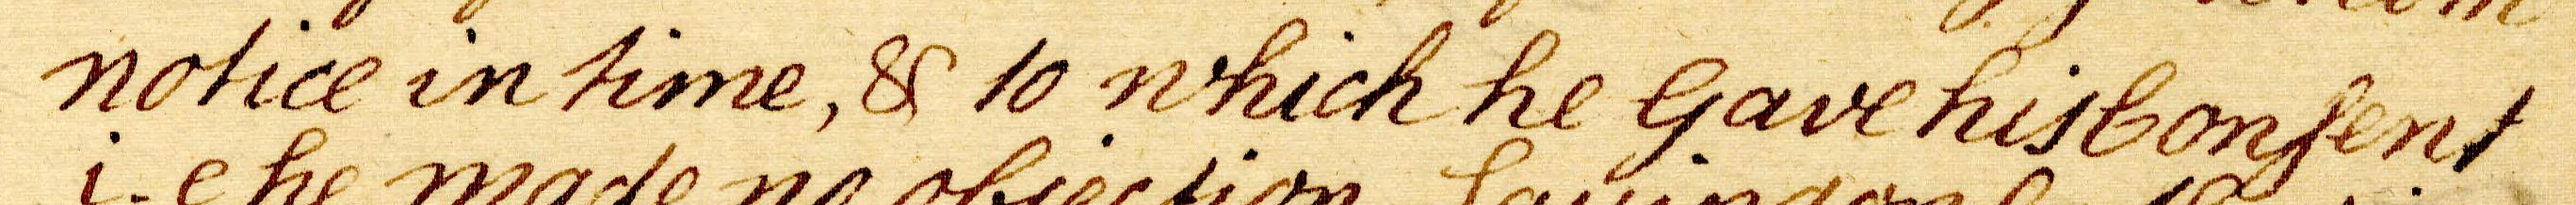notice in time, & to which he Gave his Consent
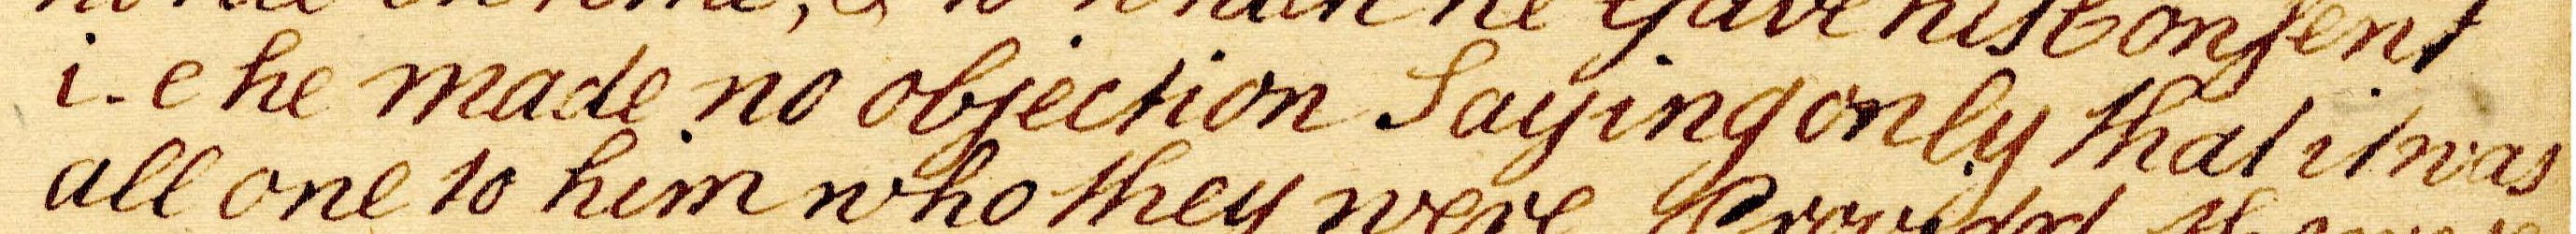i.e he made no objection Saying only that it was
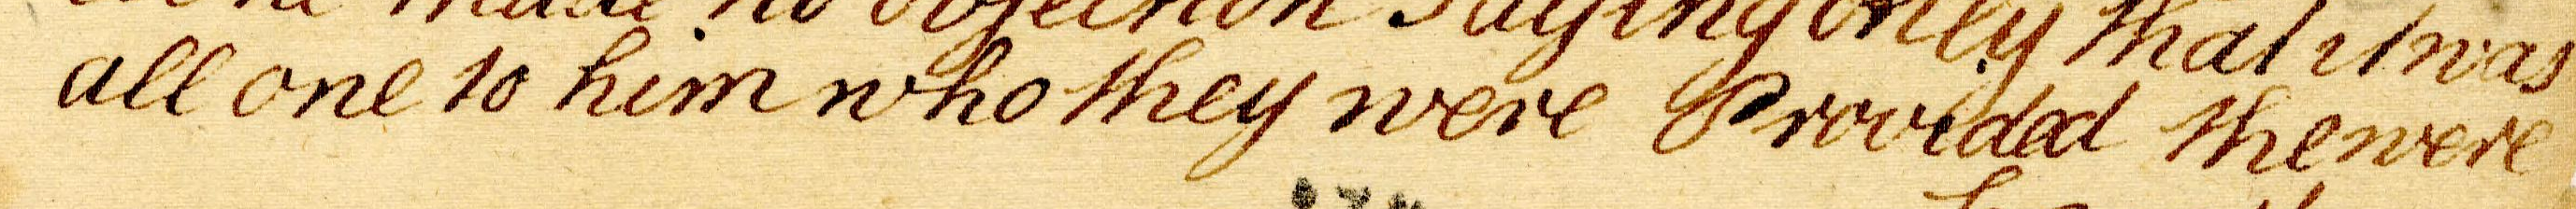all one to him who they were Provided the were
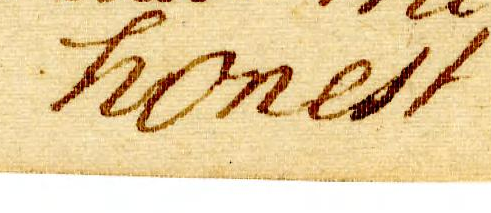honest
